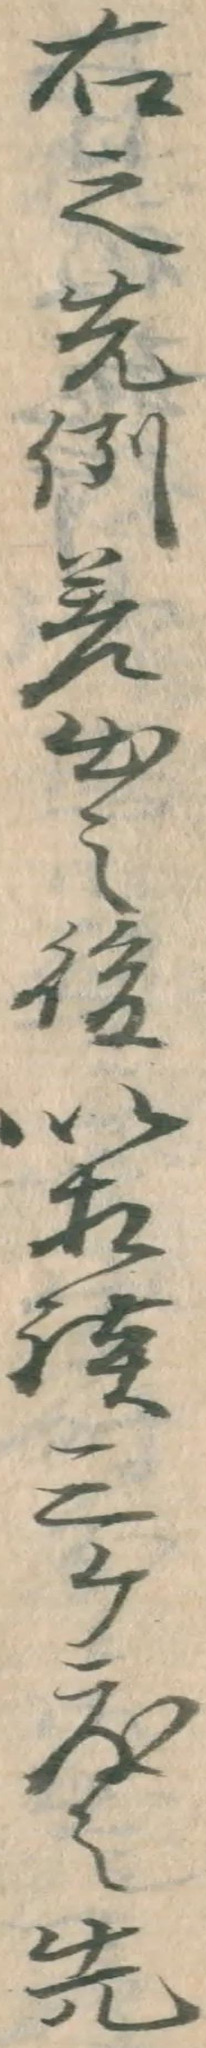右之先例差出之後以相談三ケ度之先
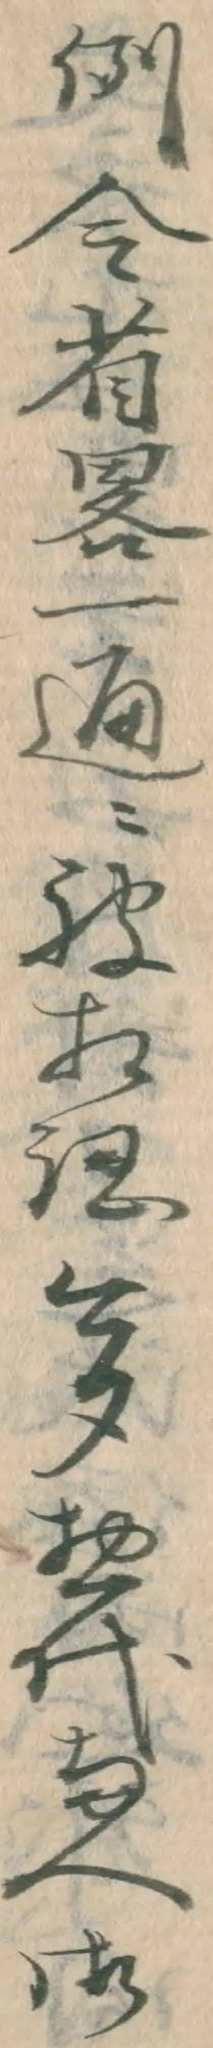例令省略一通ニ被相認今夕惣代両人御
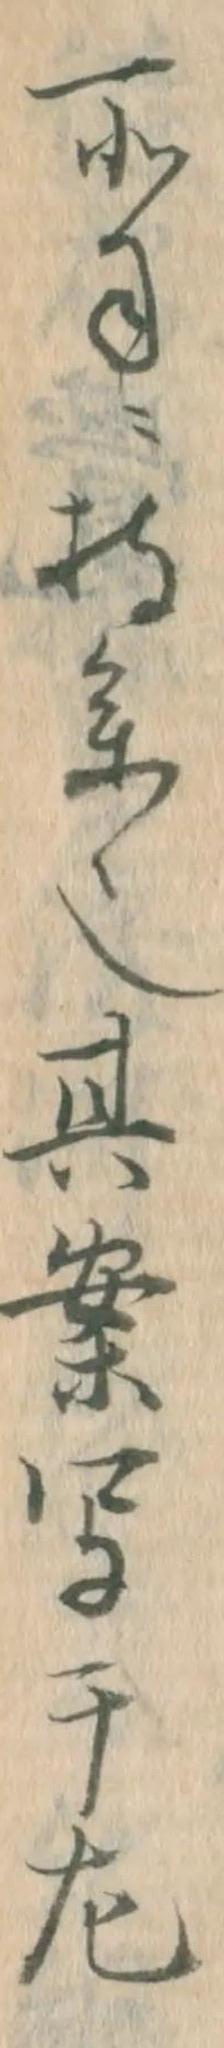所司ニ持参也其案写于左

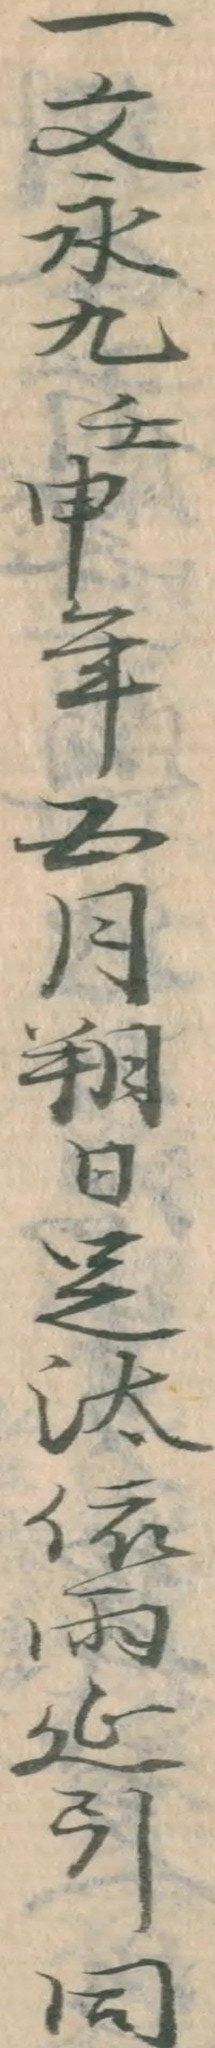一文永九壬申年五月朔日足汰依雨延引同
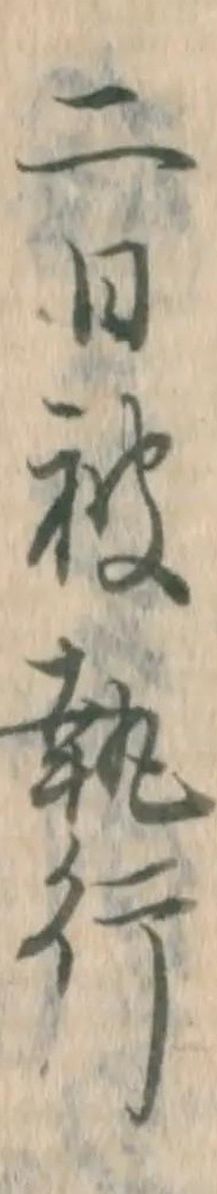二日被執行
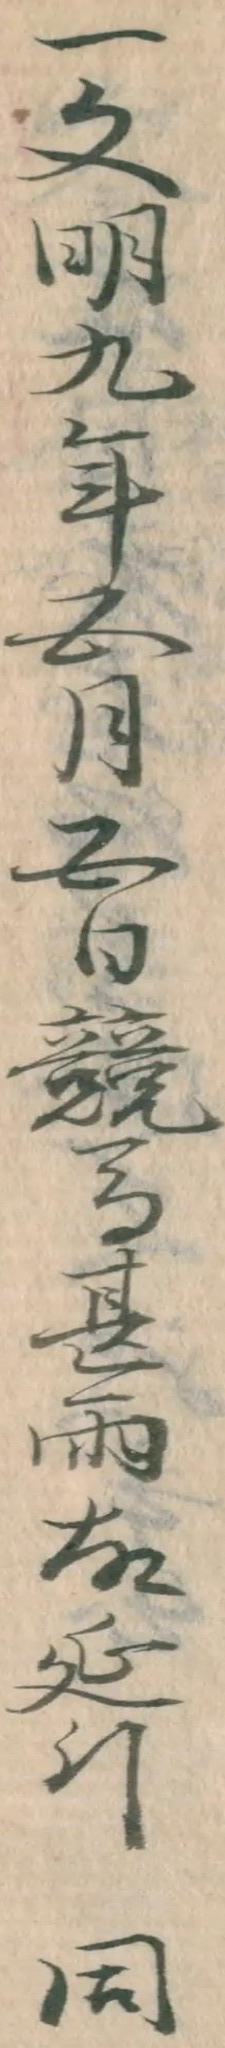一文明九年五月五日競馬甚雨故延引同
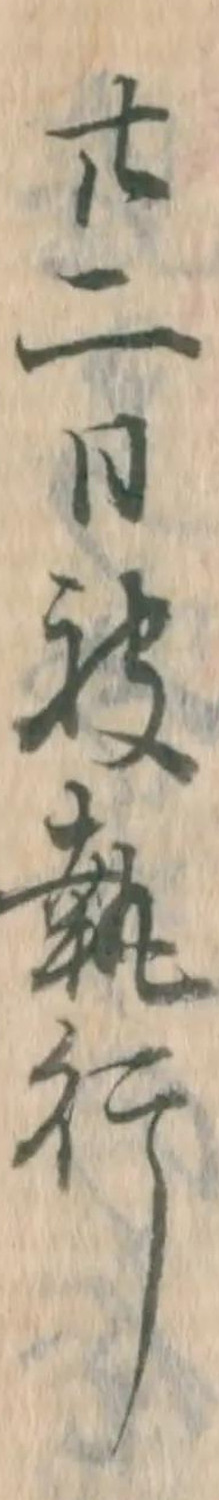廿二日被執行
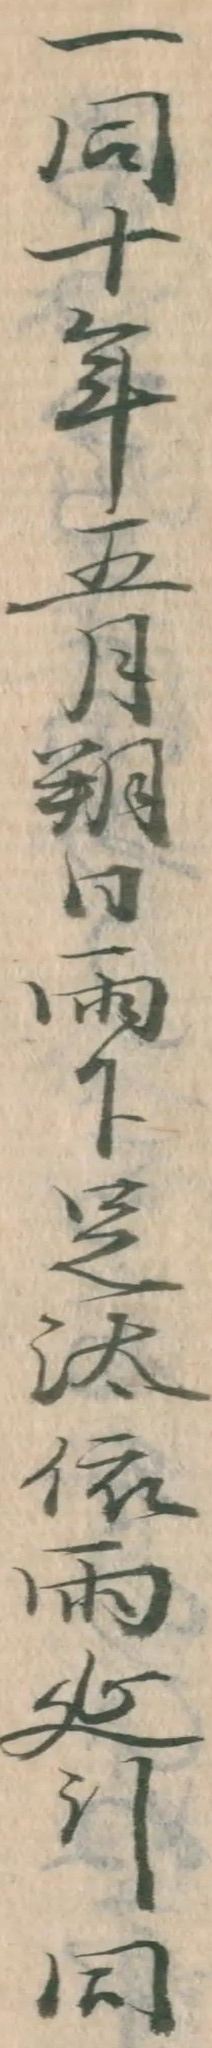一同十年五月朔日雨下足汰依雨延引同
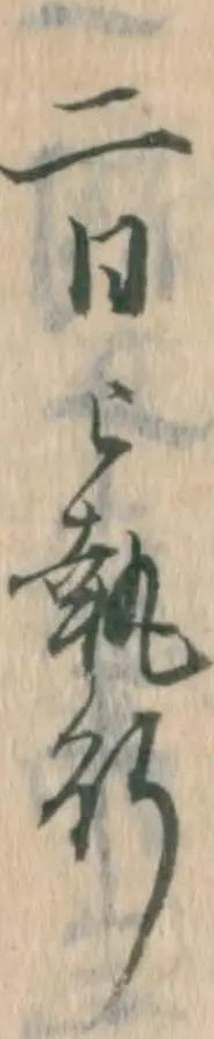二日被執行
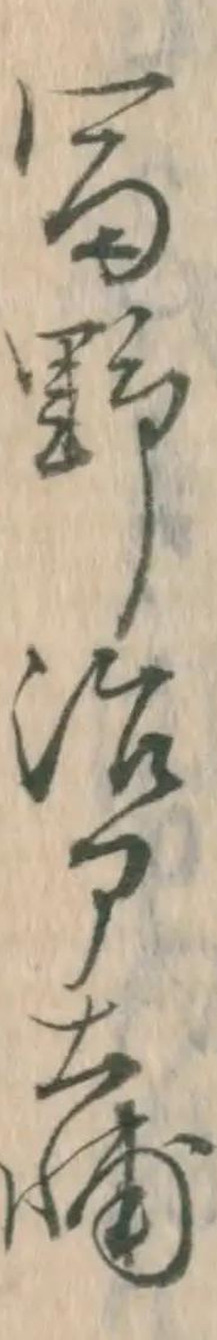冨野治部大輔
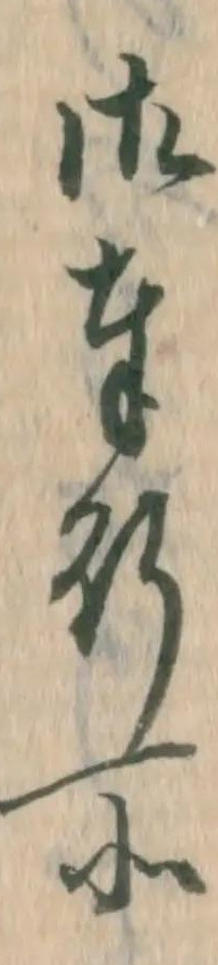御奉行所
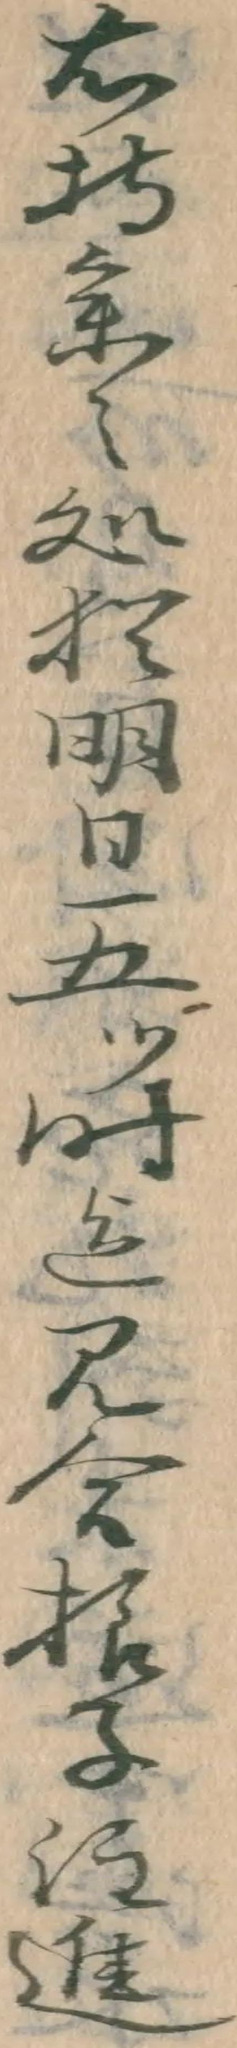右持参之処猶明日五ツ時迄見合様子注進
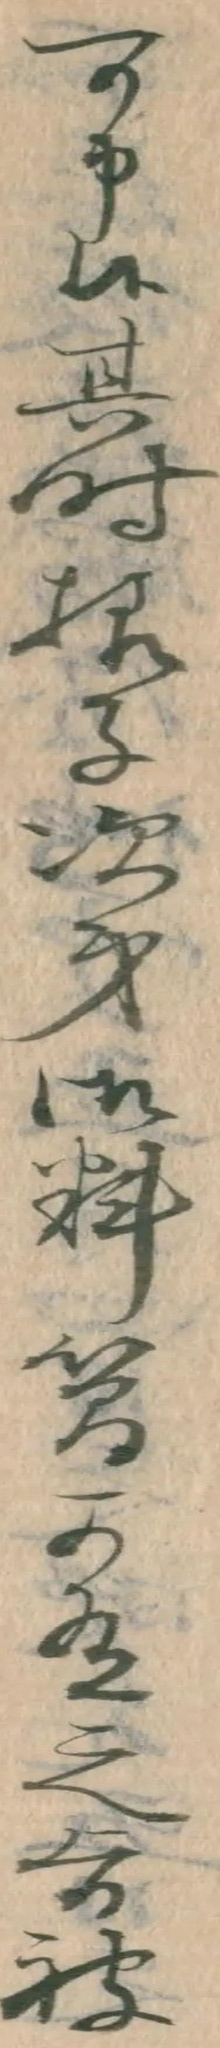可申候其時様子次第御料簡可有之旨被
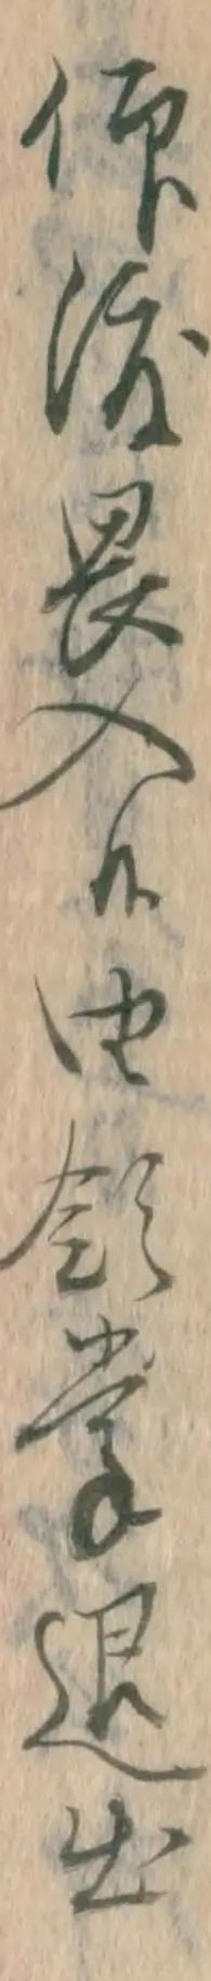仰渡畏入候由領掌退出
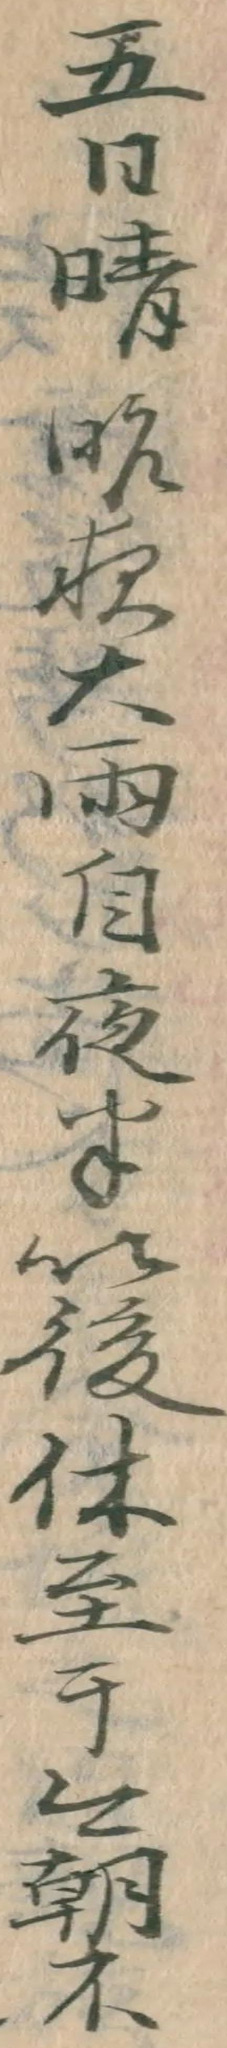五日晴昨夜大雨自夜半以後休至于今朝不
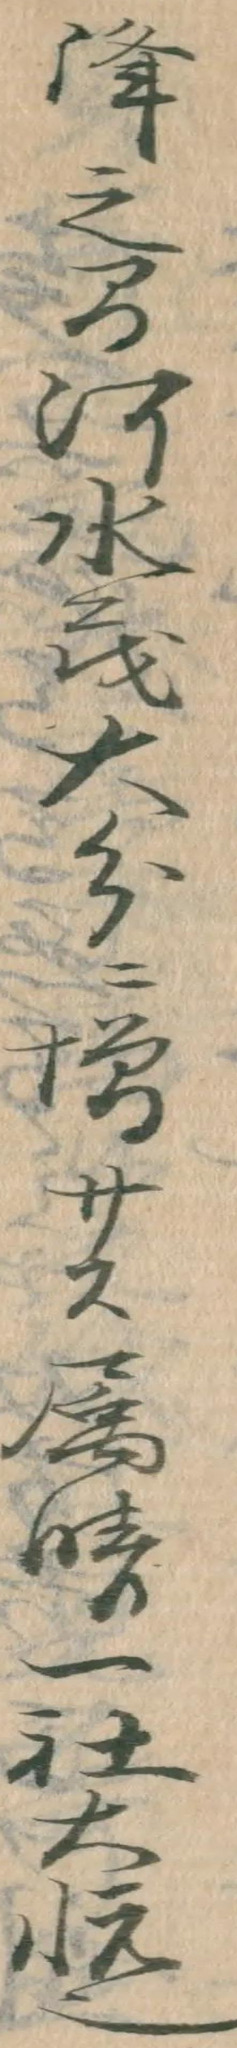降之間河水茂大分ニ増サス属晴一社大悦也
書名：賀茂社記録. 第10冊
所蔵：国立国会図書館 National Diet Library, JAPAN
